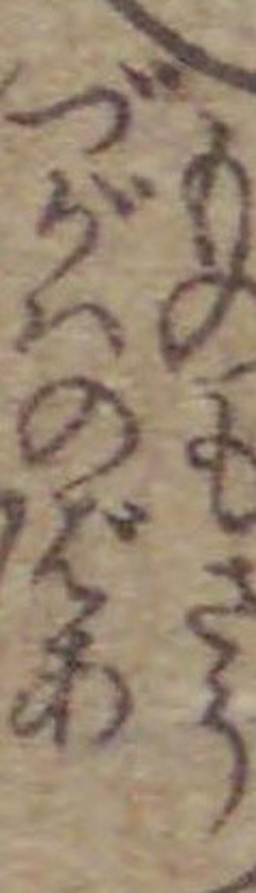づがはのばあ

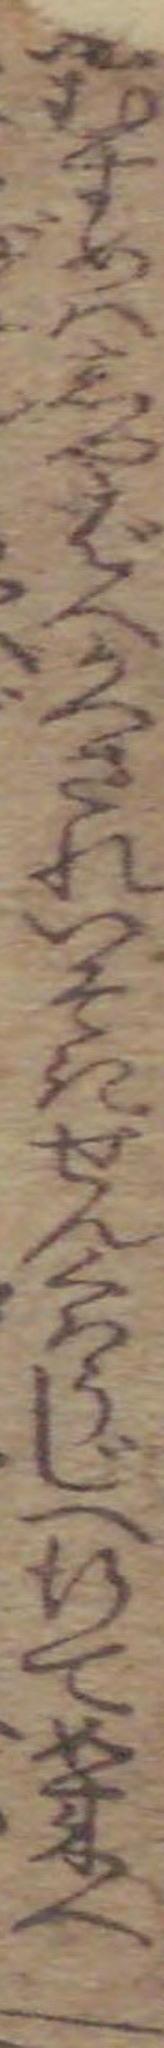鬼むすめはしやばへかへされいそきせんくわうじへ行て如来へ
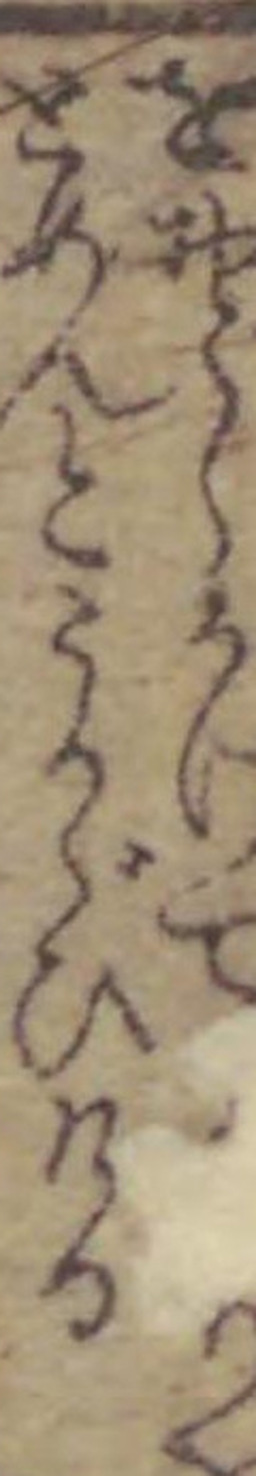とめんとうかゞひける
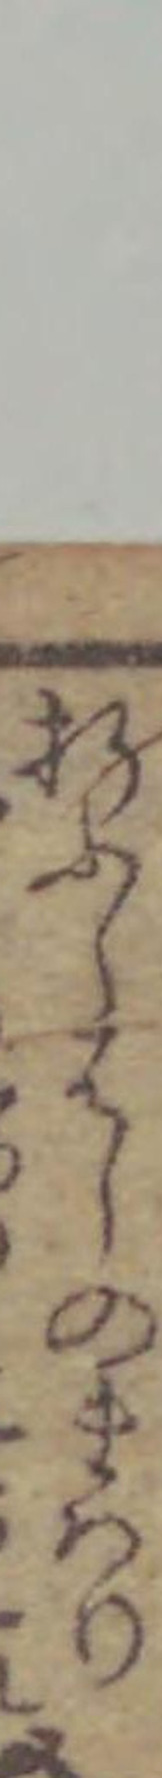折りふしはしのまはり
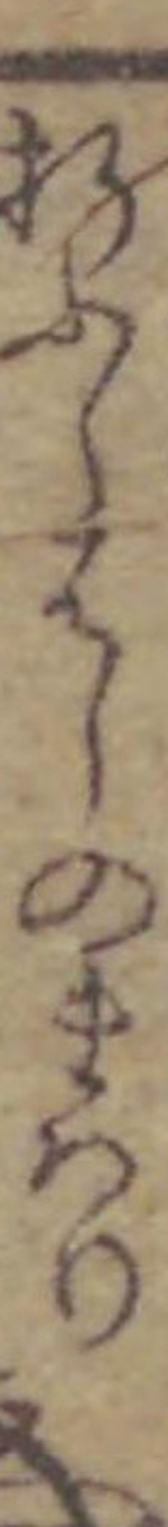折りふしはしのまはり
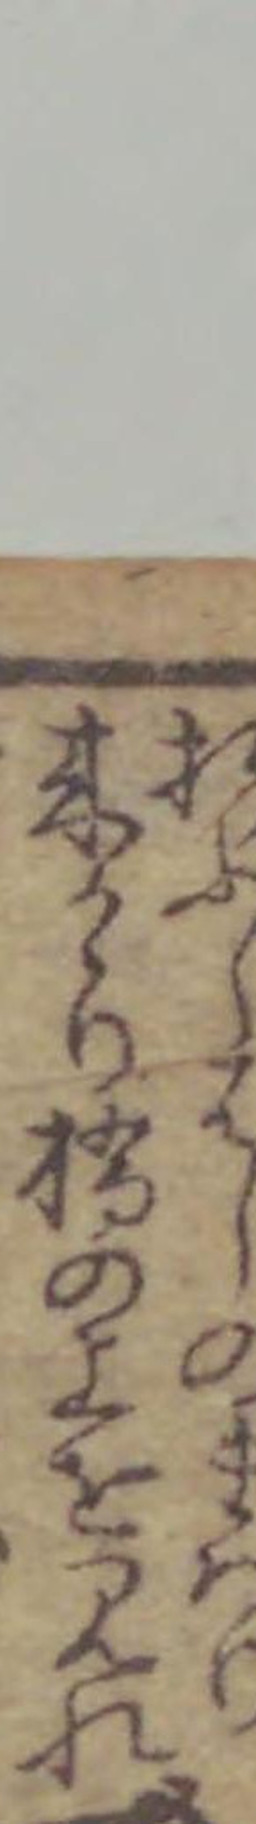来かゝり橋の上を見れ
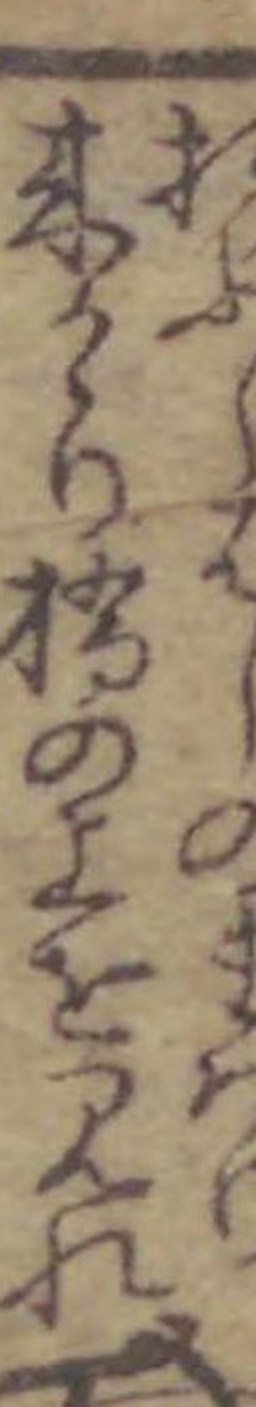来かゝり橋の上を見れ
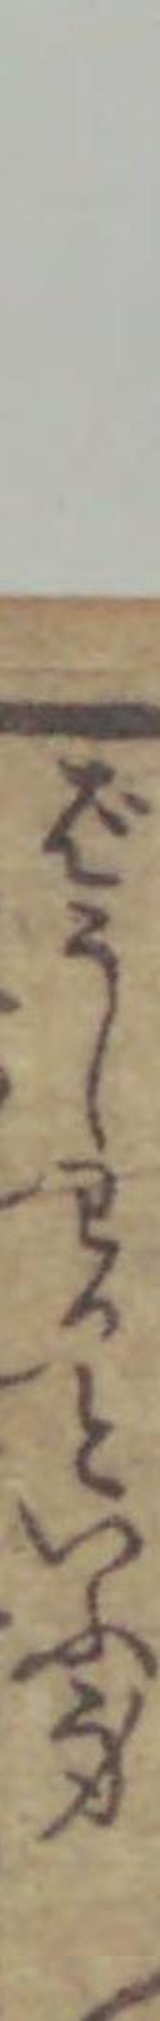ばうしわかといふ身
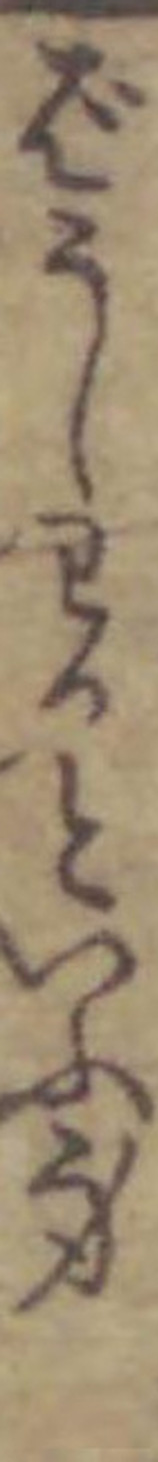ばうしわかといふ身
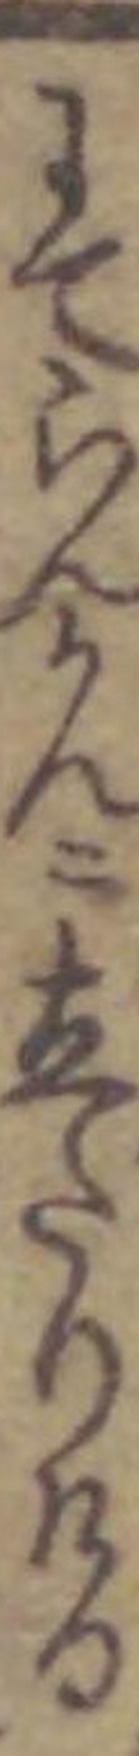にてらんかんに立たりける
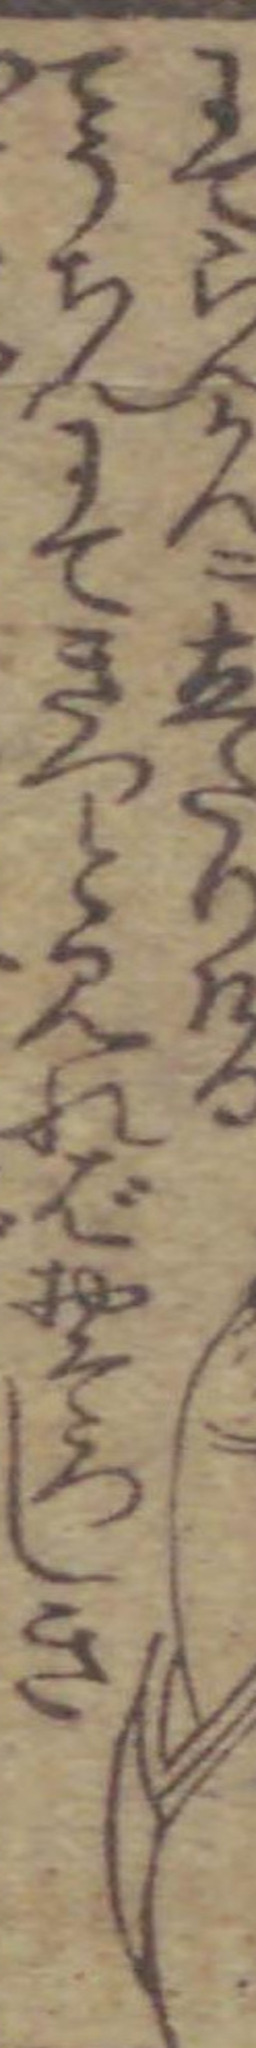てうちんにてきつと見ればおそろしき
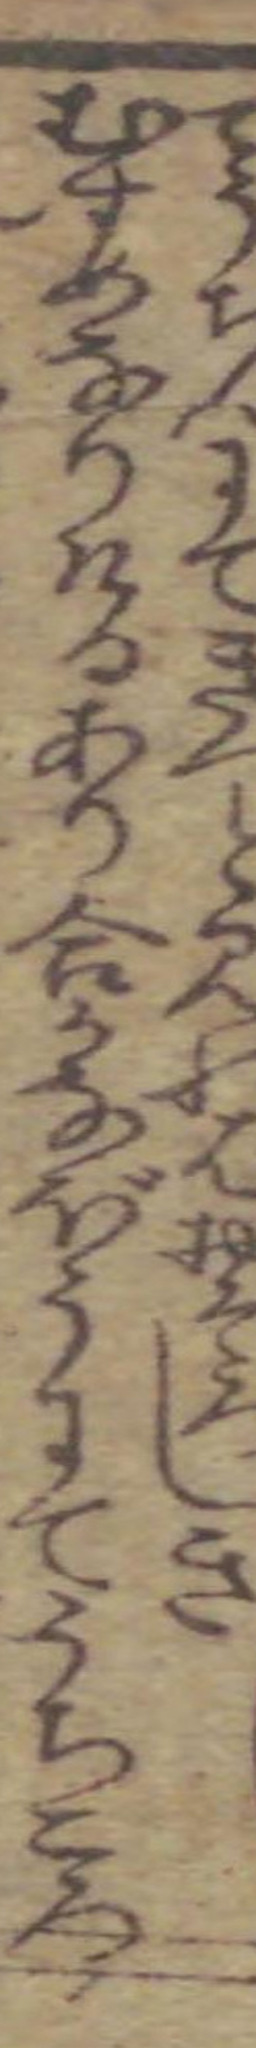むすめなりけるあり合かなぼうにてうちころ
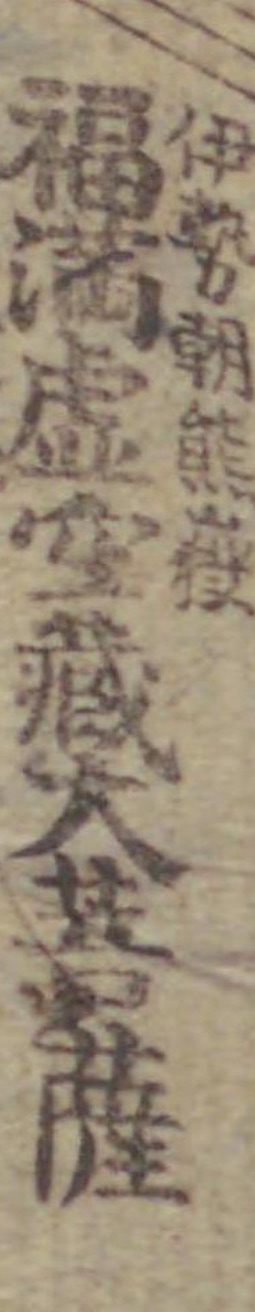福満虚空大菩薩
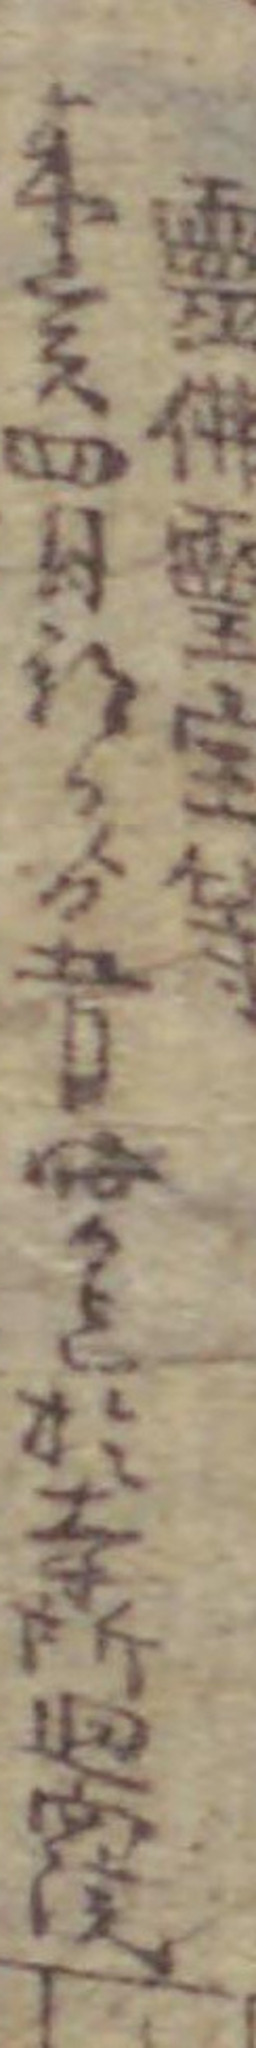来亥四月朔日ゟ五月晦日迄於本所回向院
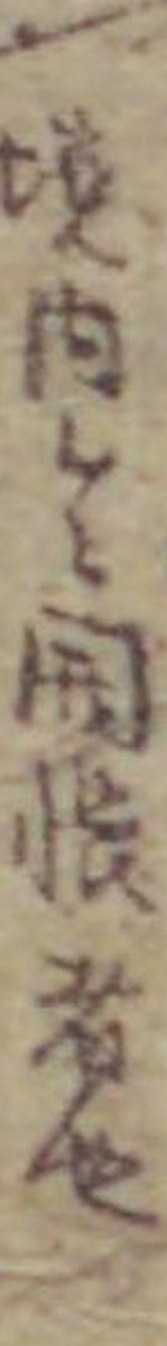境内令開帳者也
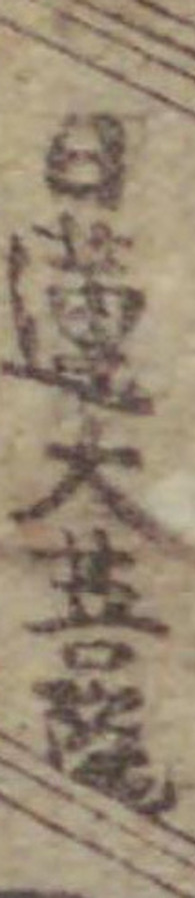日蓮大菩薩
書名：鬼の趣向草 2巻
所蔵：国立国会図書館 National Diet Library, JAPAN
